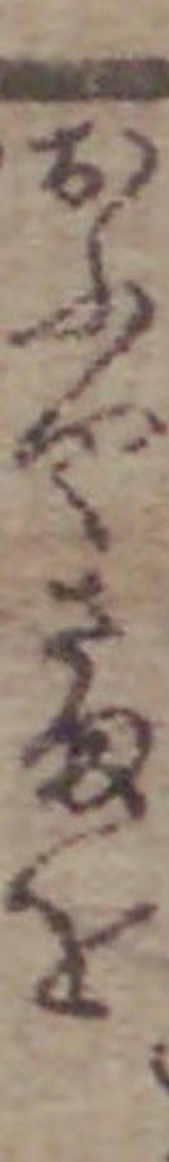おふやさまを
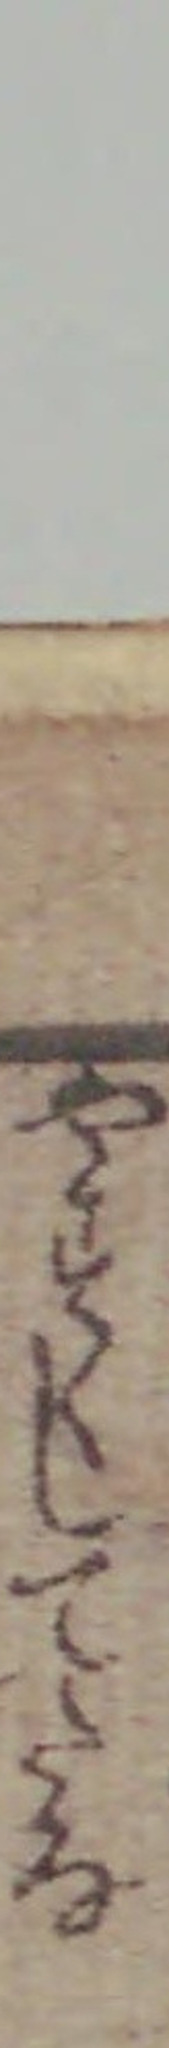やすくしてたな
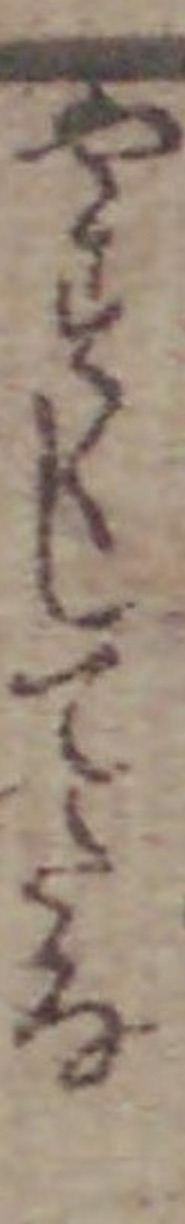やすくしてたな
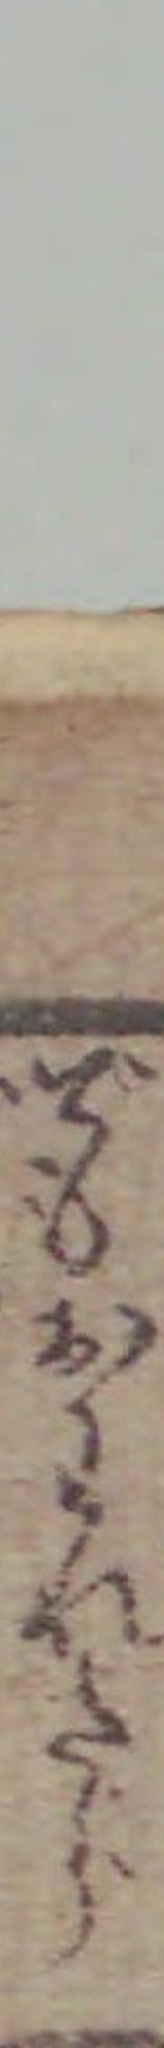でもおわれたら
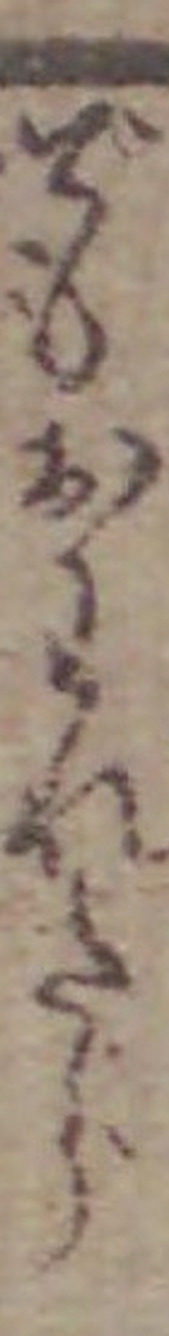でもおわれたら

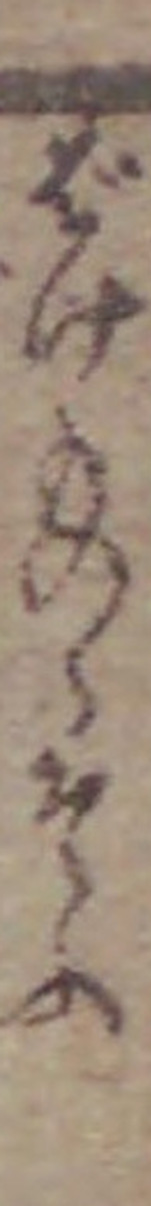ばけものゝそふ
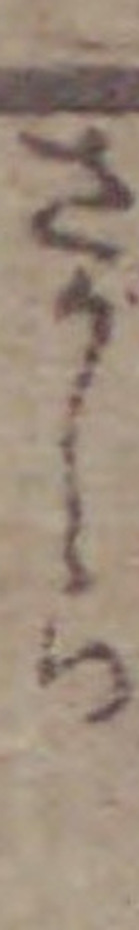さがしら
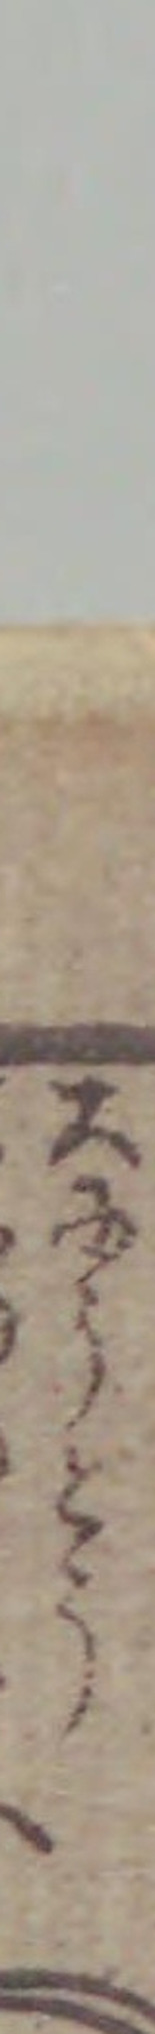大にうどう
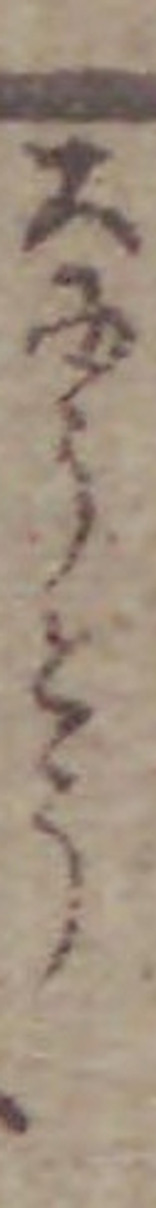大にうどう
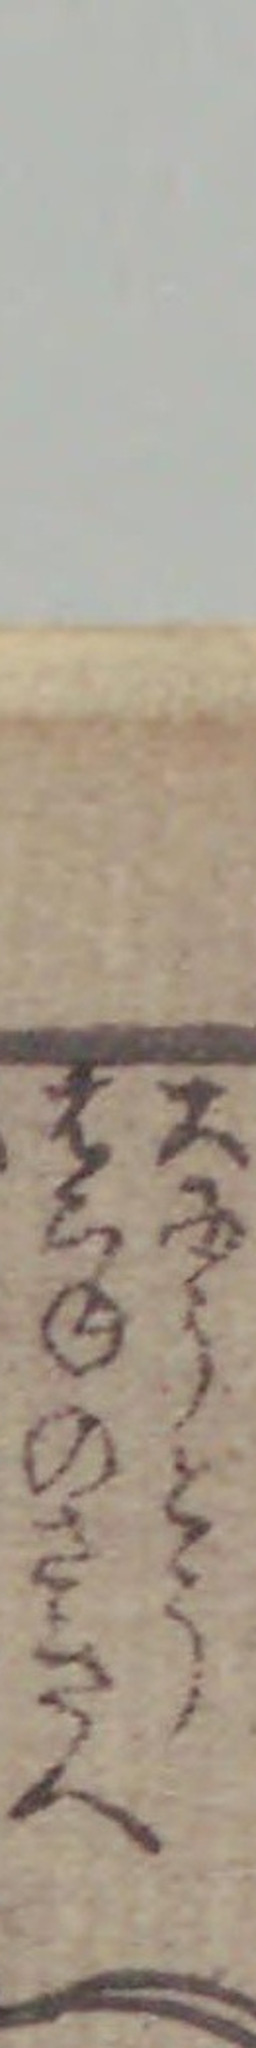はこねのさきへ
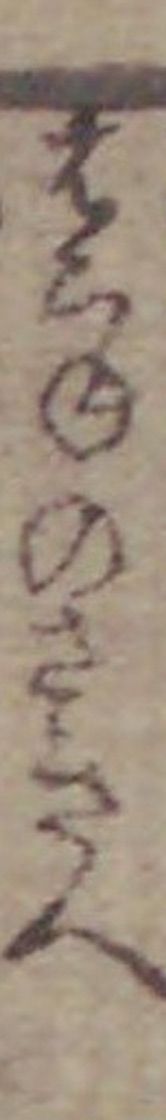はこねのさきへ
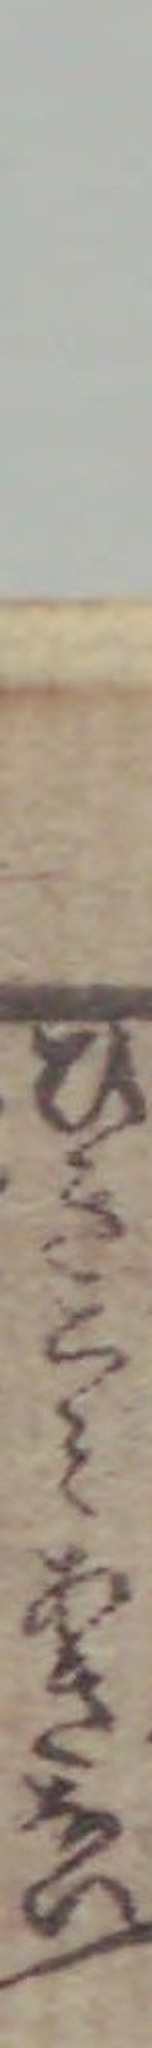ひきこみあきない
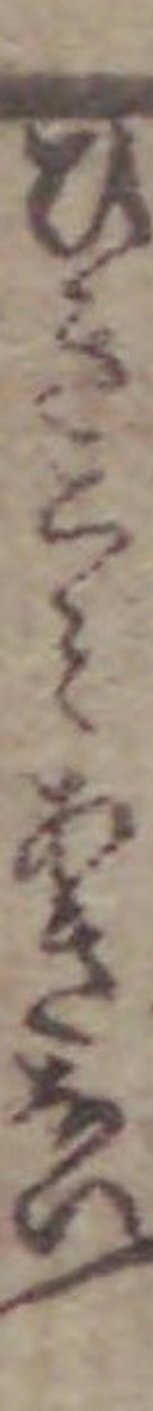ひきこみあきない
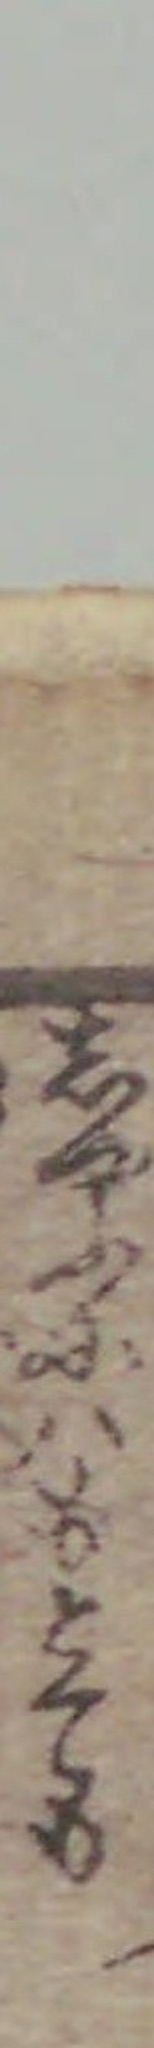しやふにはもとても
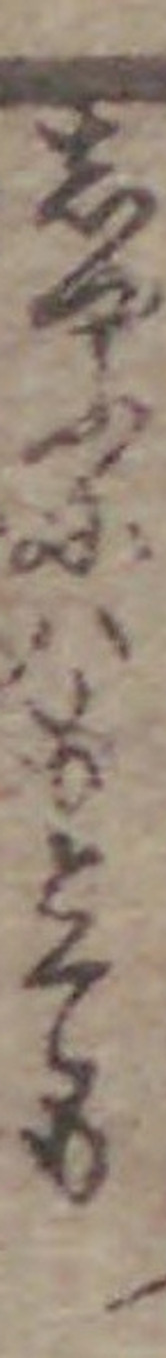しやふにはもとても
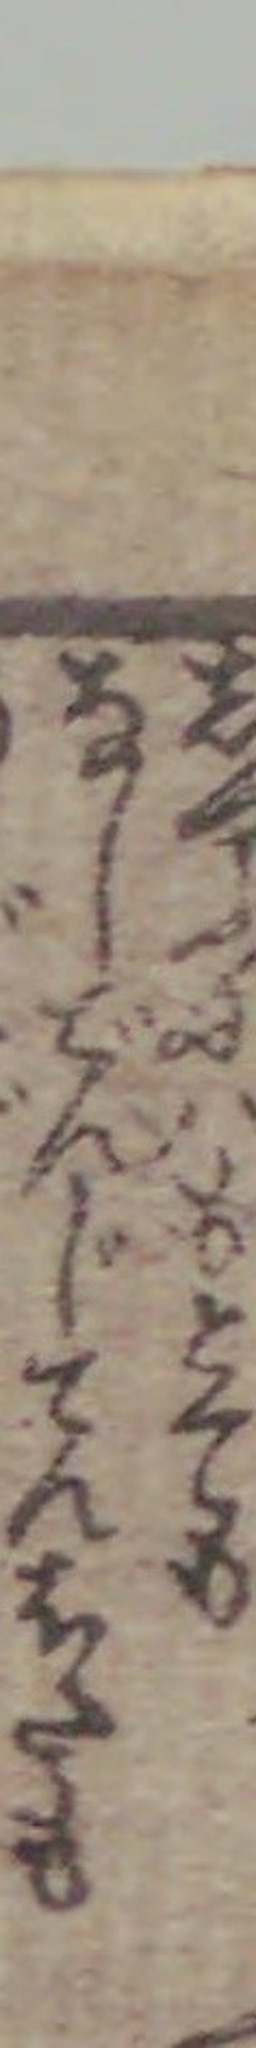なしでんじてんはたも
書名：化物鼻がひしげ 2巻
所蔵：国立国会図書館 National Diet Library, JAPAN
